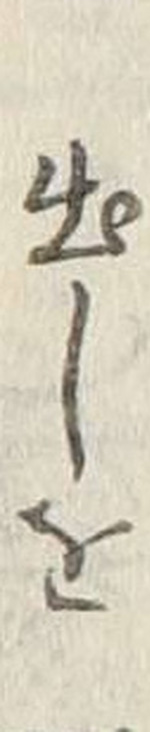出しを
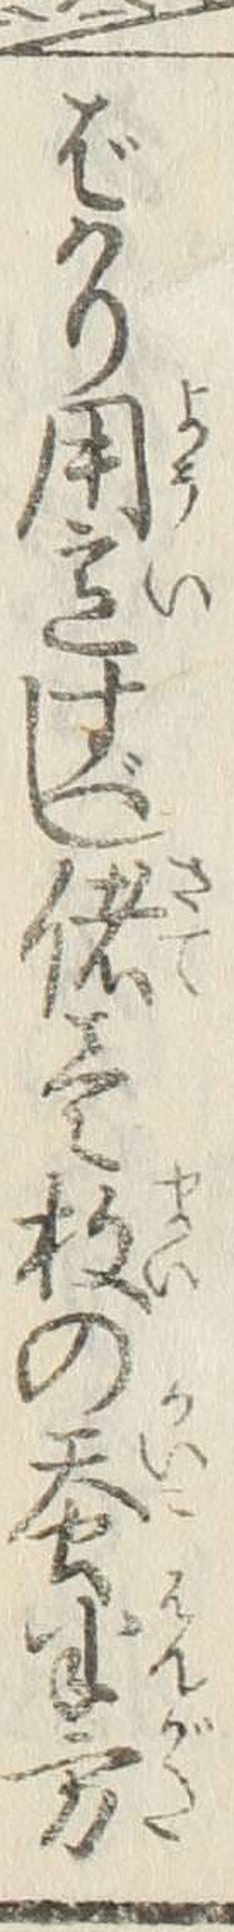ばかり用意すべし偖壱枚の蚕半方
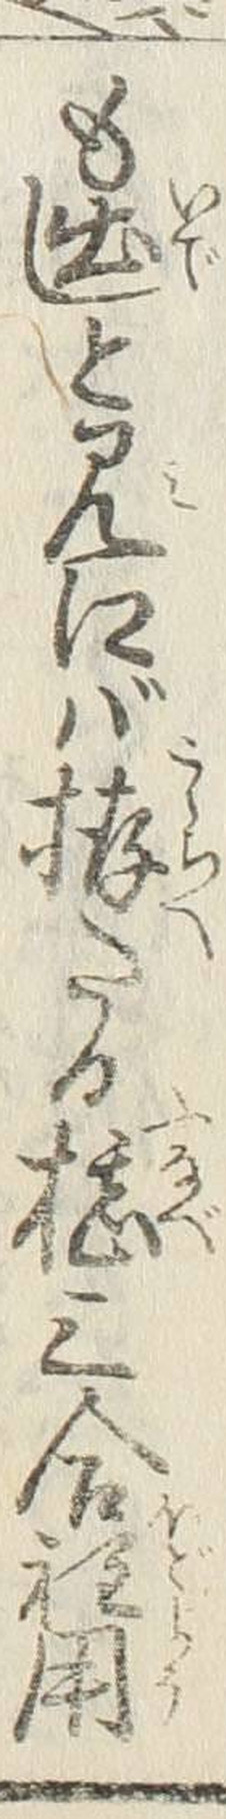も出しと見えば拵たる椹三合程用
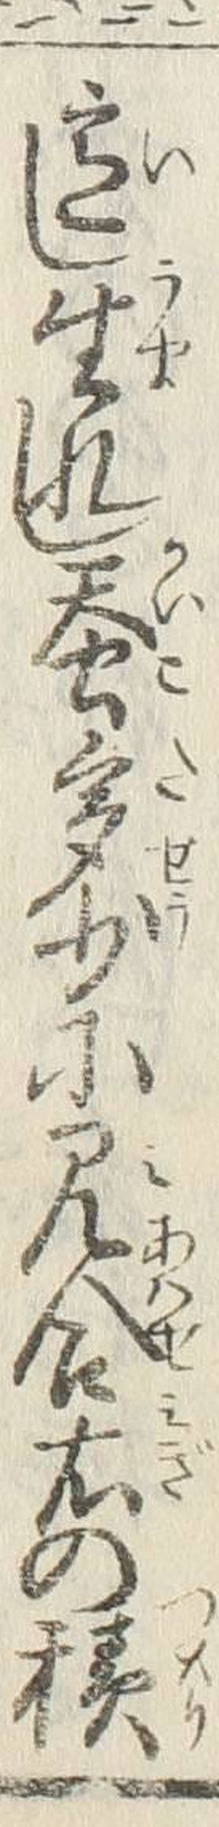意し生れし蚕多少に見合右の積
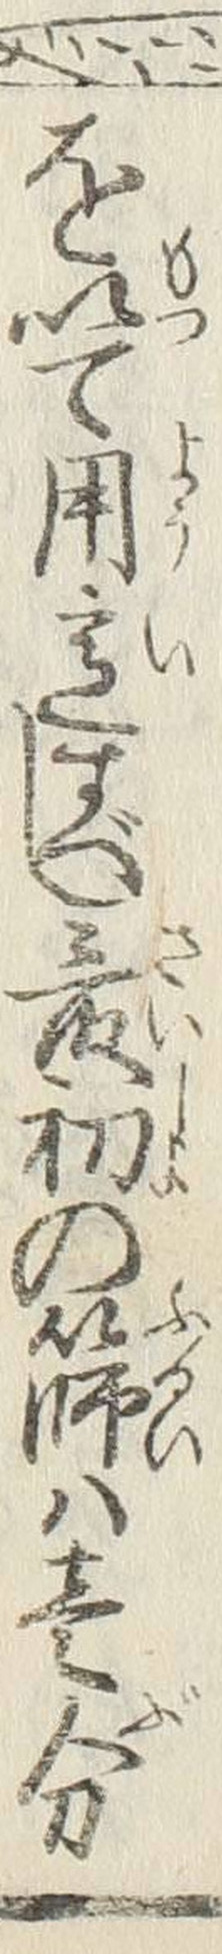を以て用意すべし最初の篩は壱分
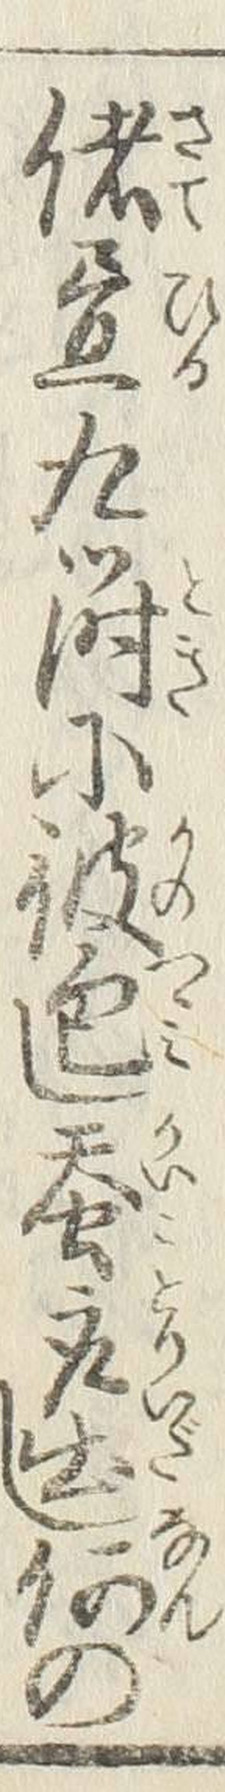偖昼九ッ時に彼包し蚕取出し何の
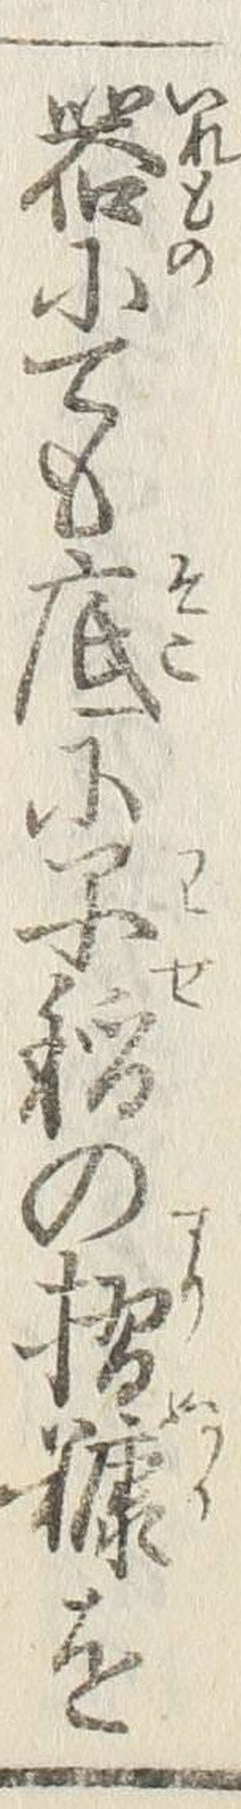器にても底に早稲の摺糠を
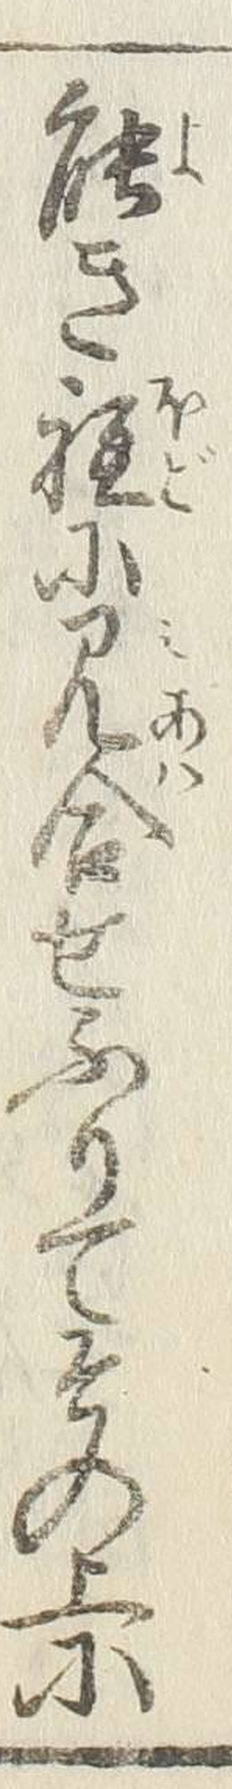能き程に見合せふりてその上に
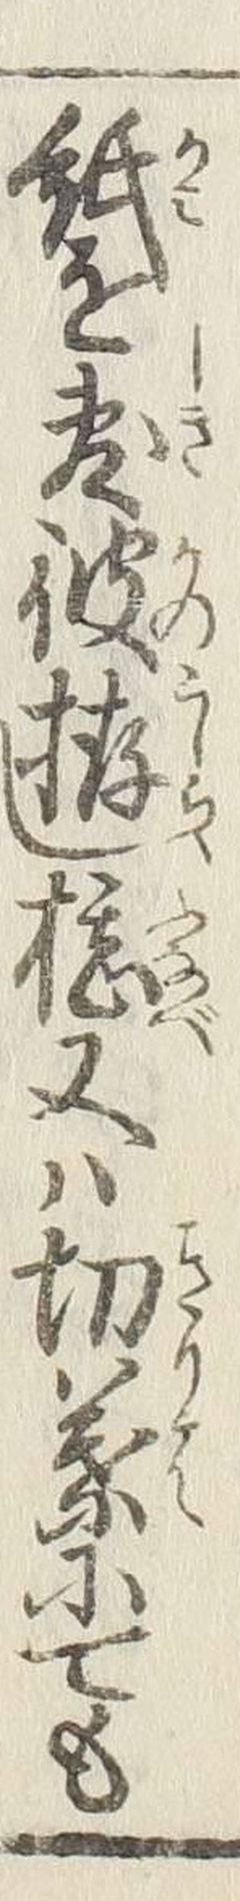紙を敷彼拵し椹又は切葉にても
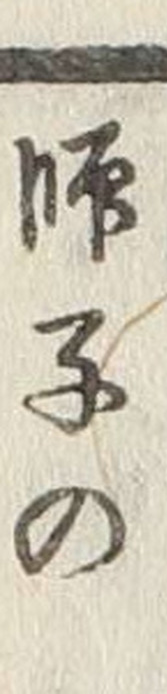師子の
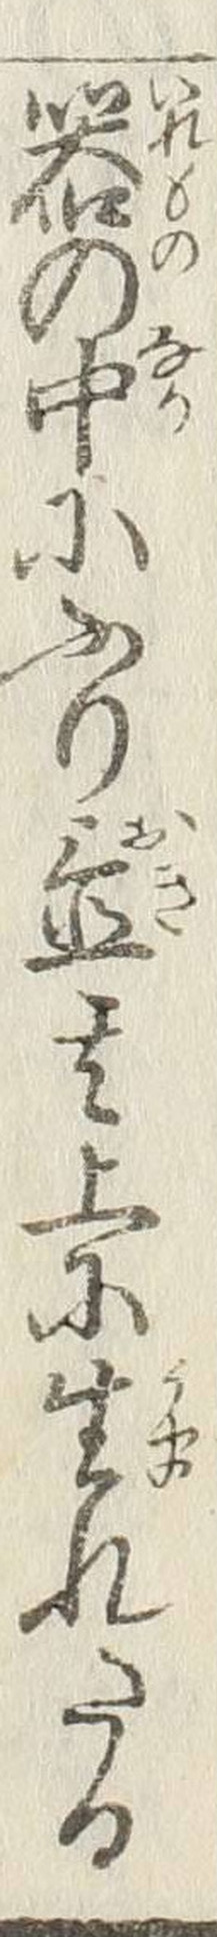器の中にふり置其上に生れたる
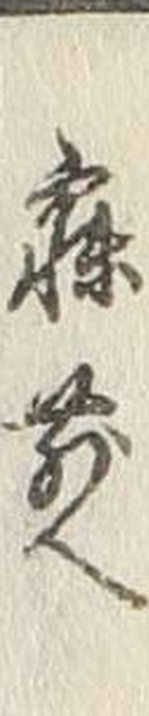寐前へ
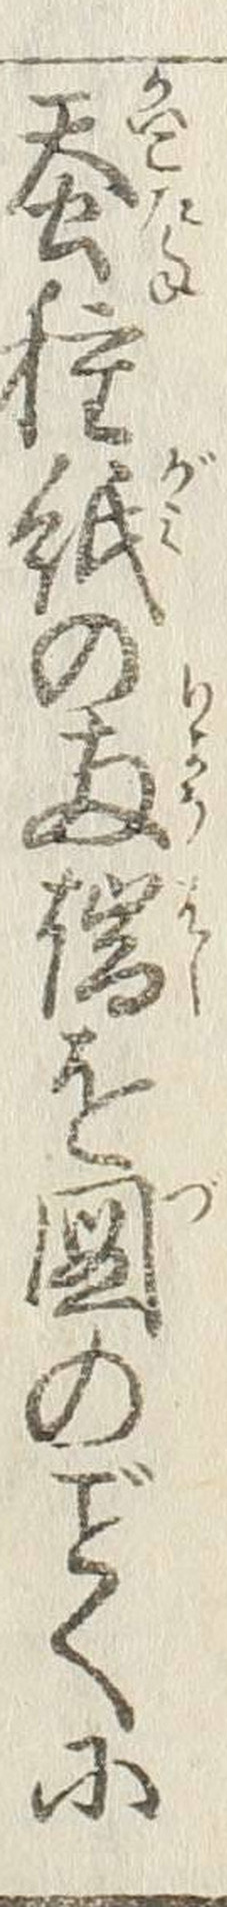蚕種紙の両端を図のごとくに
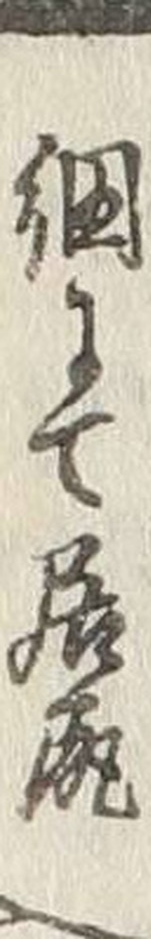細にて居尻
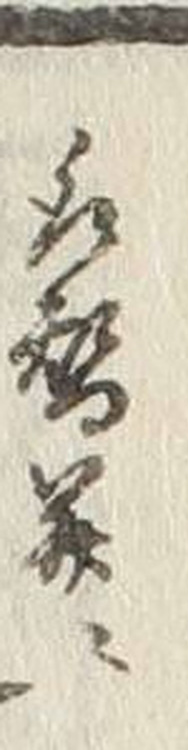取替幷に
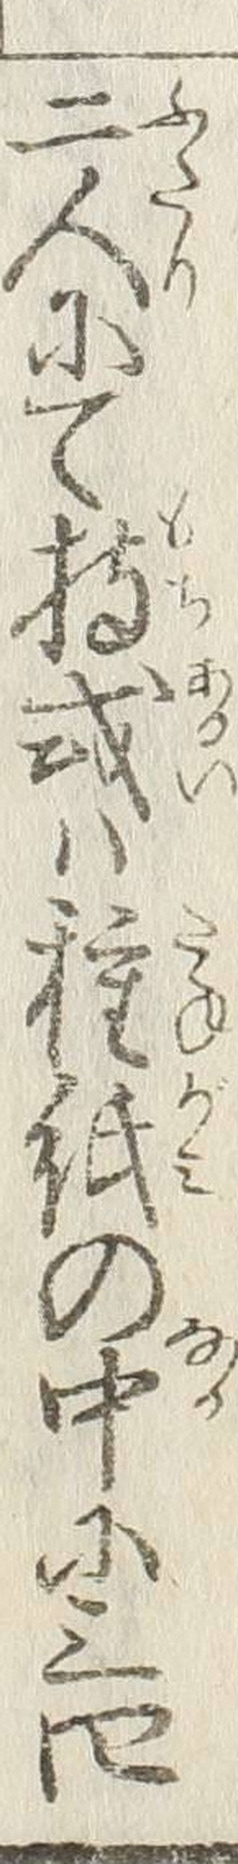二人にて持或は種紙の中に三四
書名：養蠶實驗録
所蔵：東京大学農学生命科学図書館 国文学研究資料館
